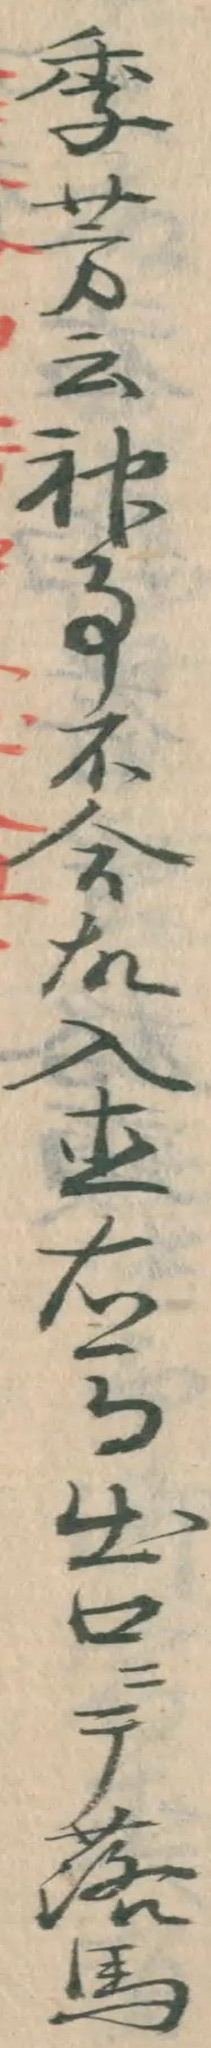季芳云神事不合故入直右馬出口ニテ落馬
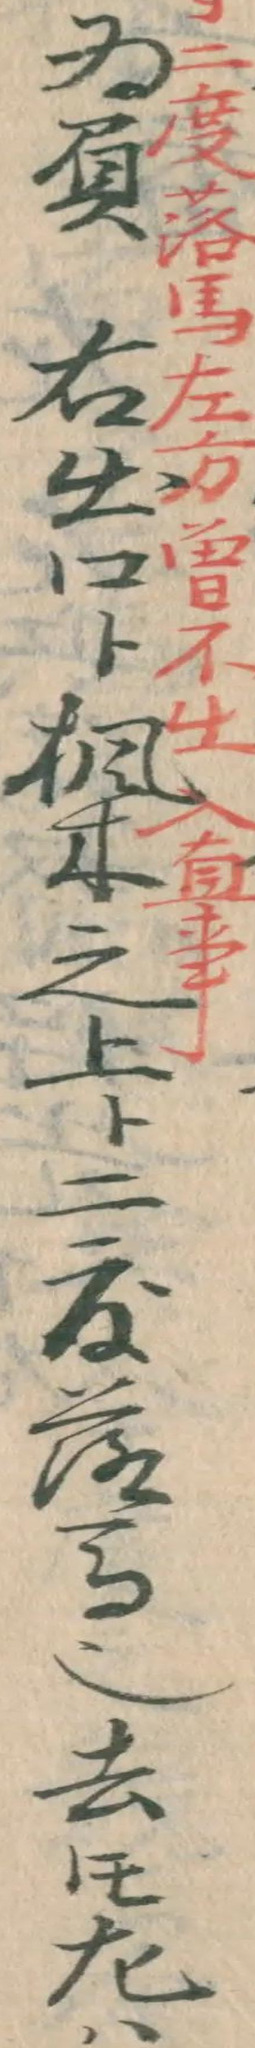為負右出口ト楓木之上ト二度落馬也去トモ左ハ
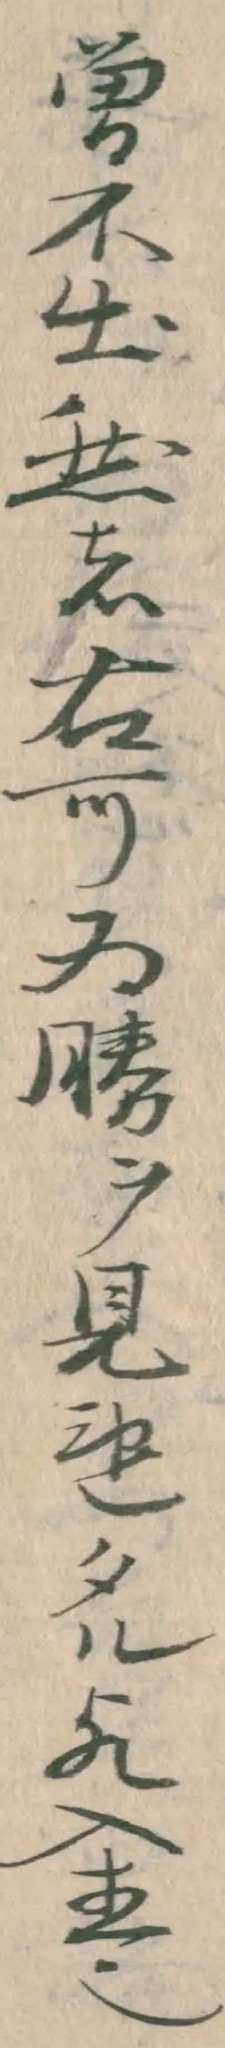曽不出然者右可為勝ヲ見れタル歟入直也
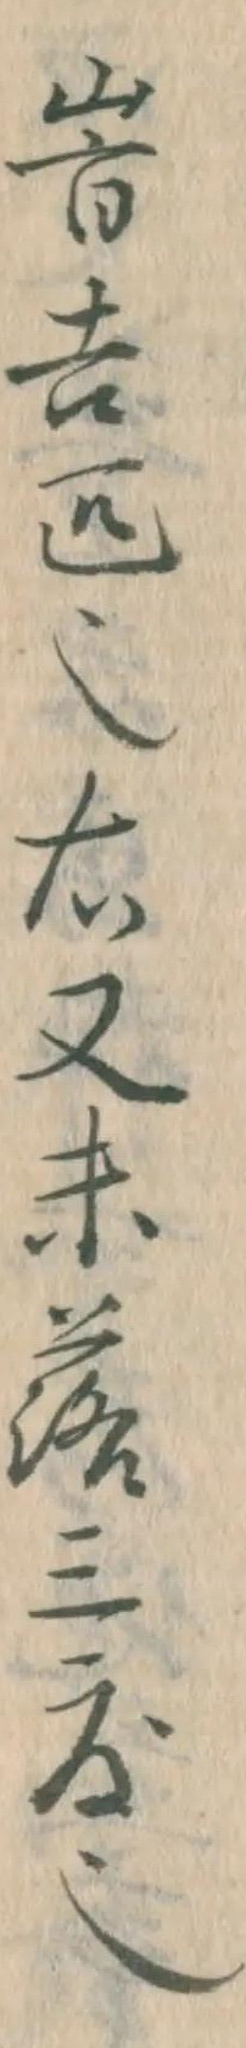旹吉匹也右又未落三度也
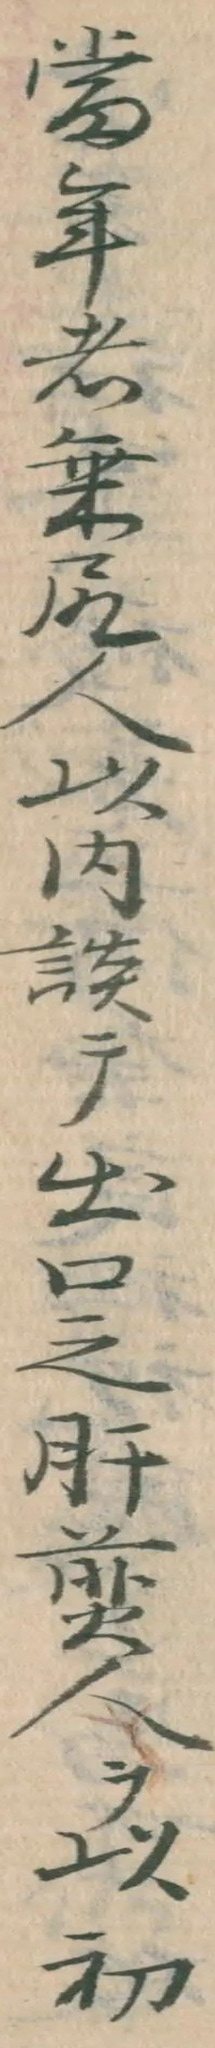当年者乗尻人以内談テ出口之肝煎人ヲ以初
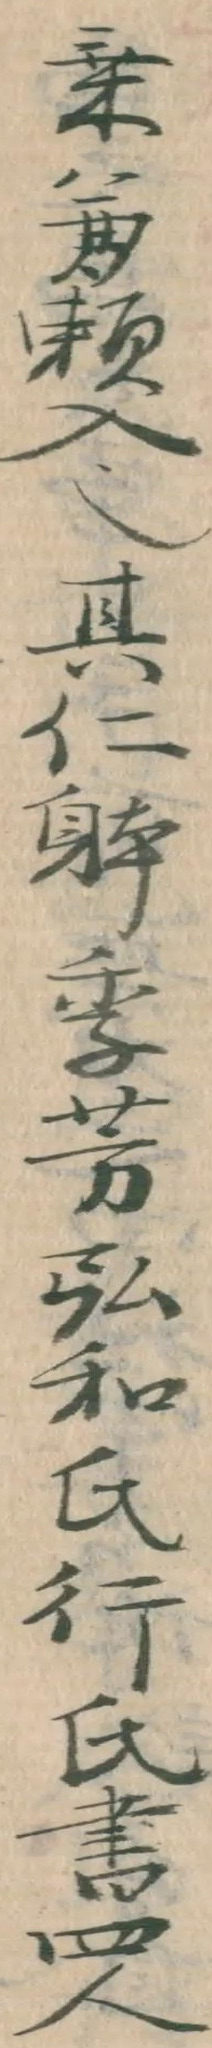乗兼頼入也其仁体季芳弘和氏行氏書四人
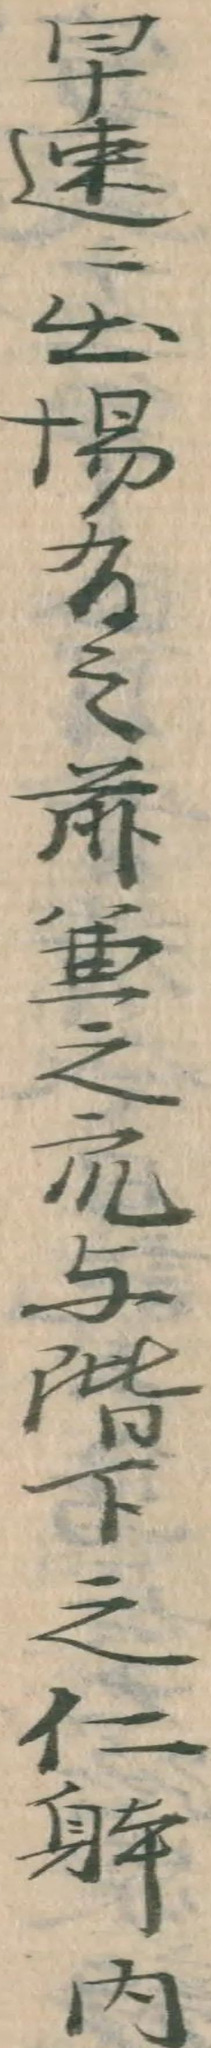早速ニ出場有之前兼之衆与階下之仁体内
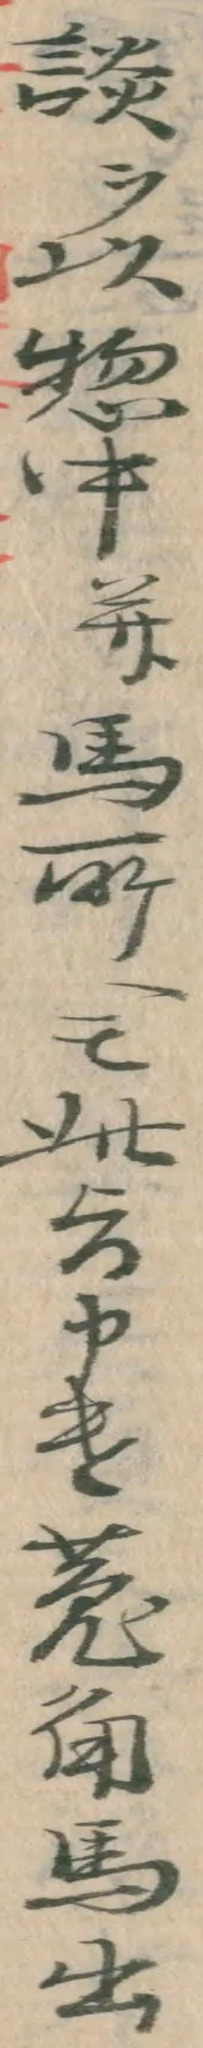談ヲ以惣中并馬所へモ此旨申遣兎角馬出
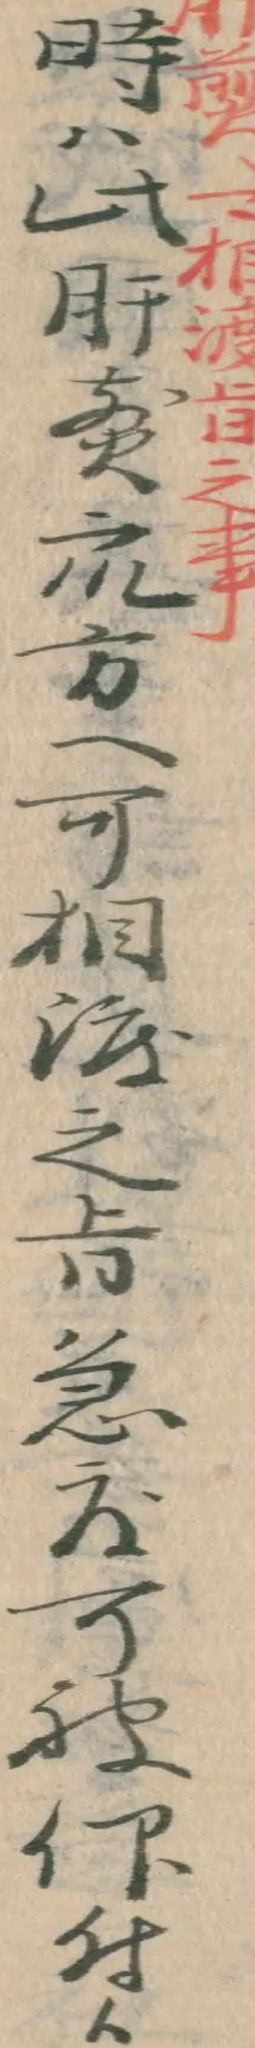時ハ此肝煎衆方へ可相渡之旨急度可被仰付候
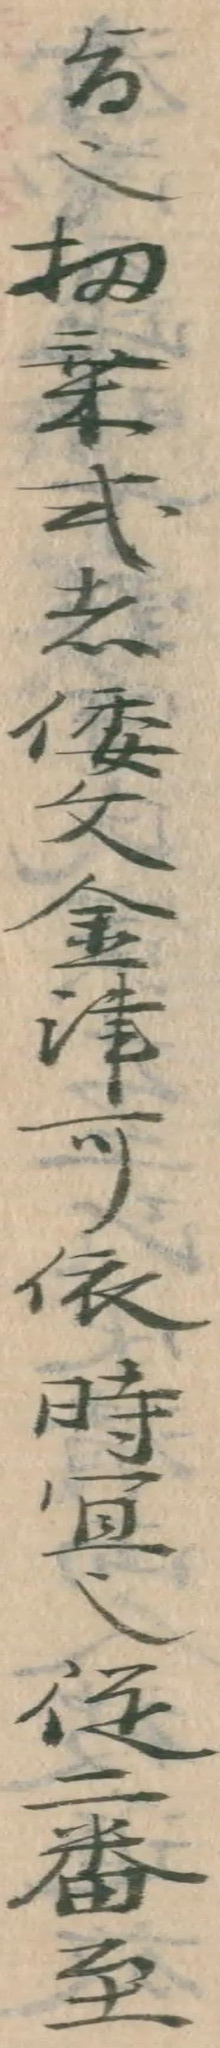旨也扨乗式者倭文金津可依時宜也従二番至
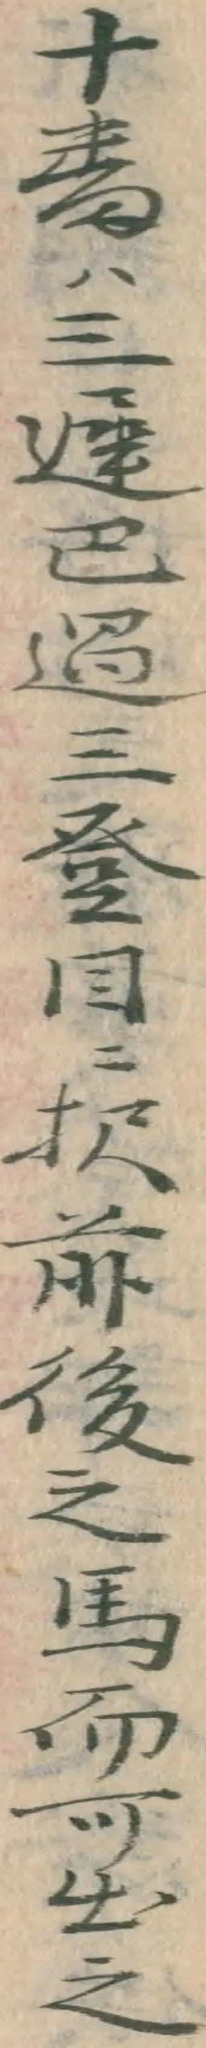十番ハ三遅巴過三登目ニ択前後之馬而可出之
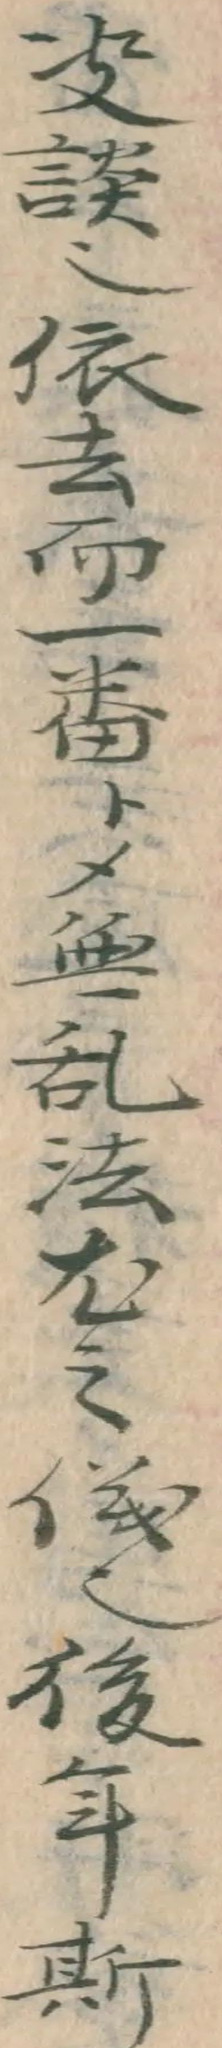決談也依去而一番トシテ無乱法尤之儀也後年斯
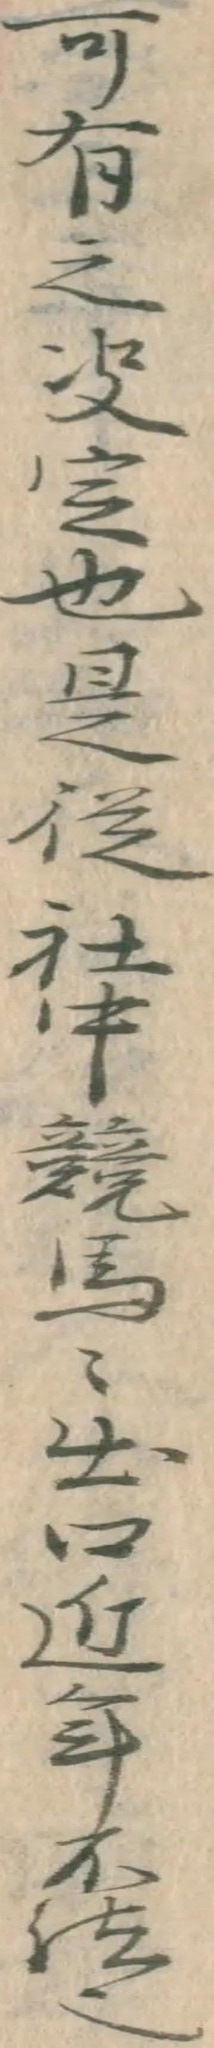可有之決定也是従社中競馬々出口近年不法也
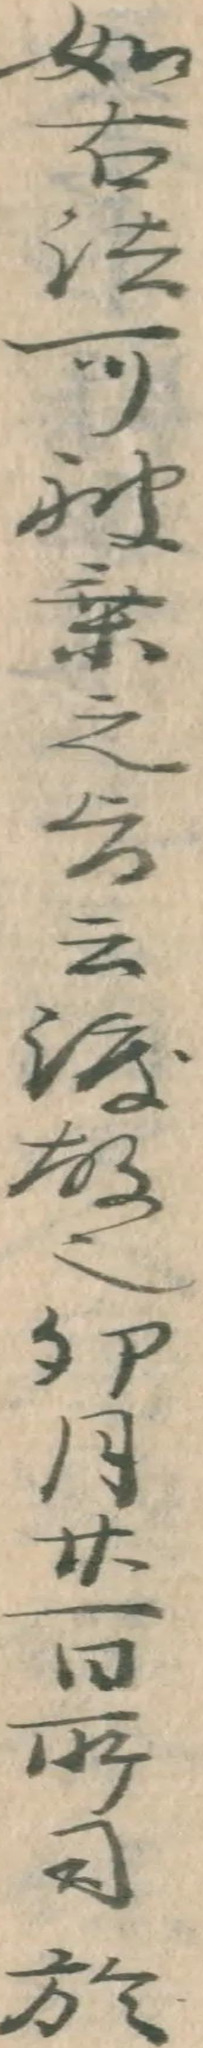如古法可被棄之旨云渡故也卯月廿一日所司於
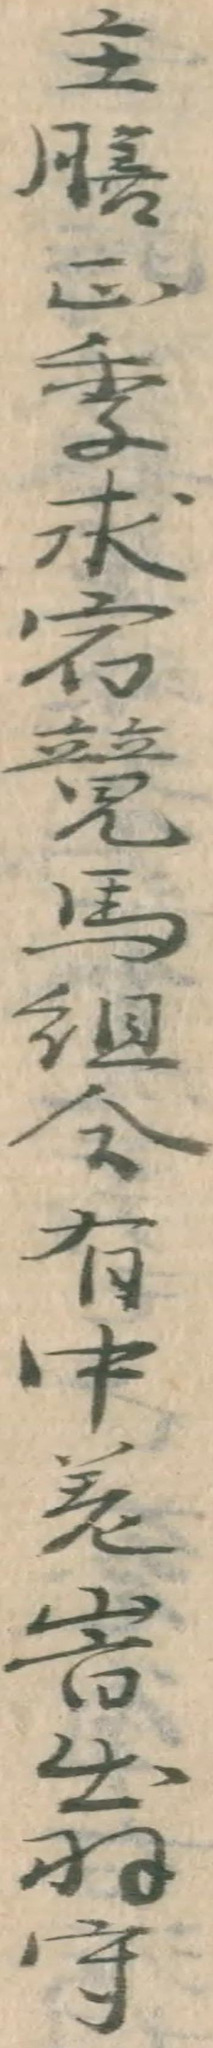主膳正季求宿競馬組合有中差旹出羽守
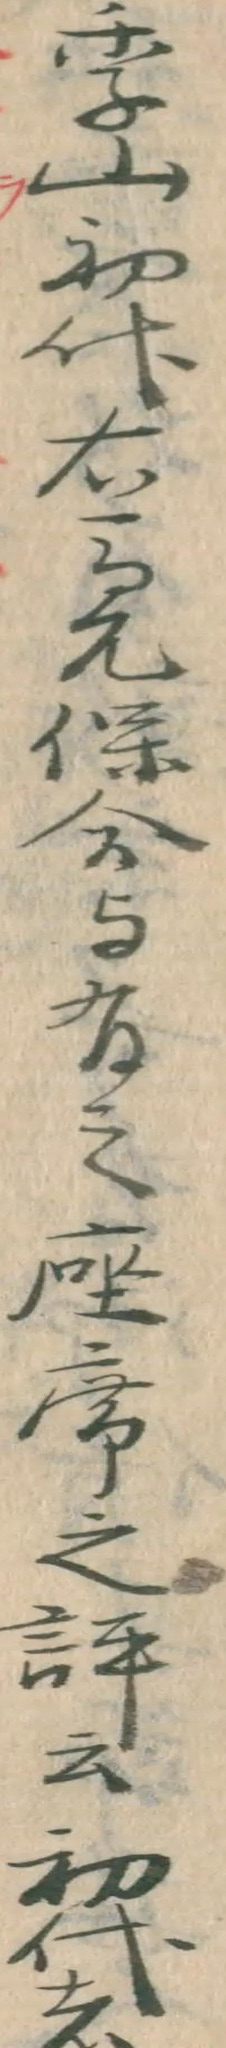季山初代右馬允保合与有之座席之評云初代者
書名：賀茂社記録. 第10冊
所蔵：国立国会図書館 National Diet Library, JAPAN
